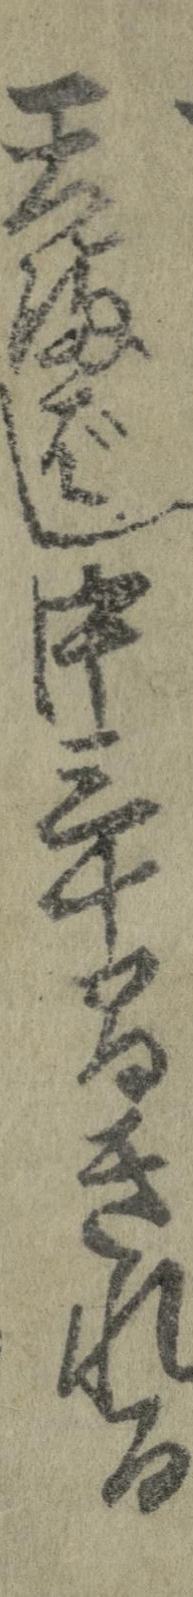天満ばし中三十間きれる
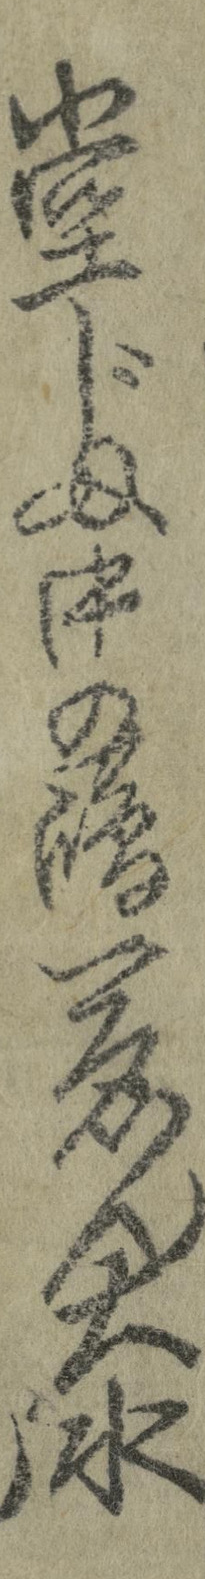堂じま中の嶋一ゑん大水
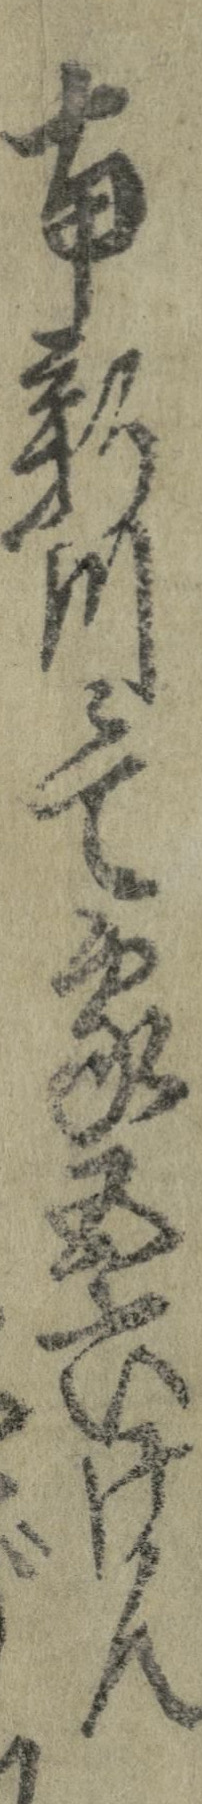南新川にて家五六けん
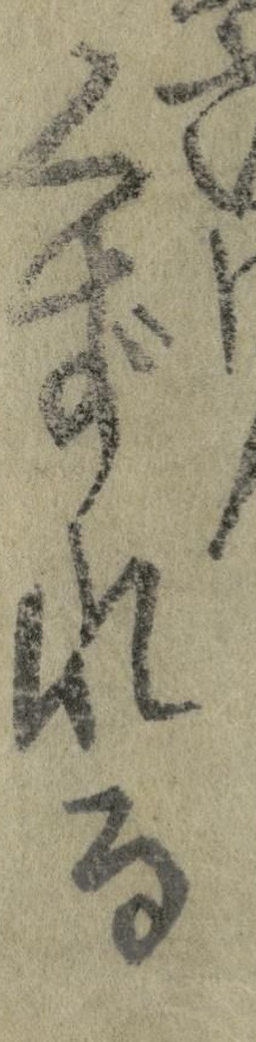くずれる
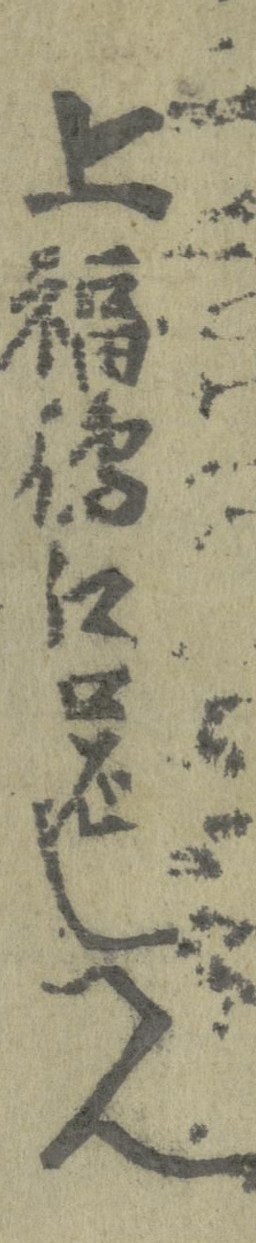上福嶋江口ばしへん
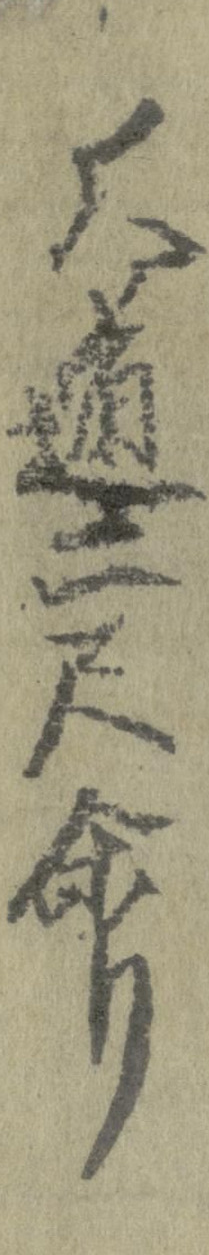大通二尺余り
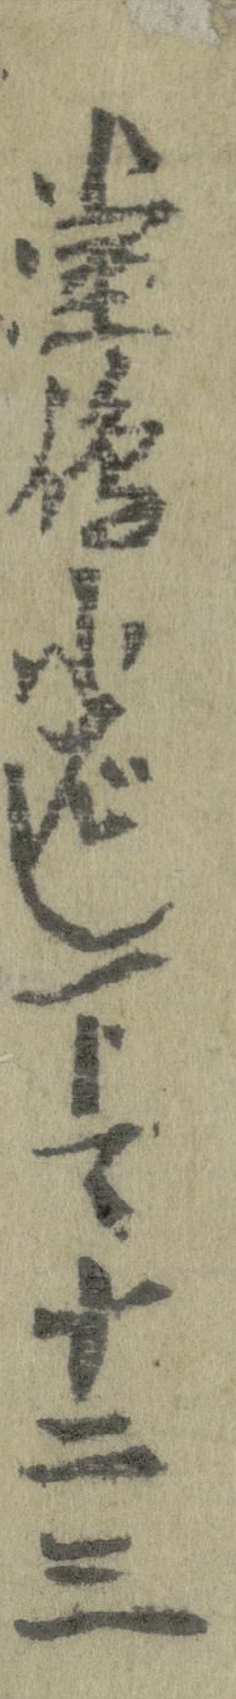堂嶋小ばし下て十二三
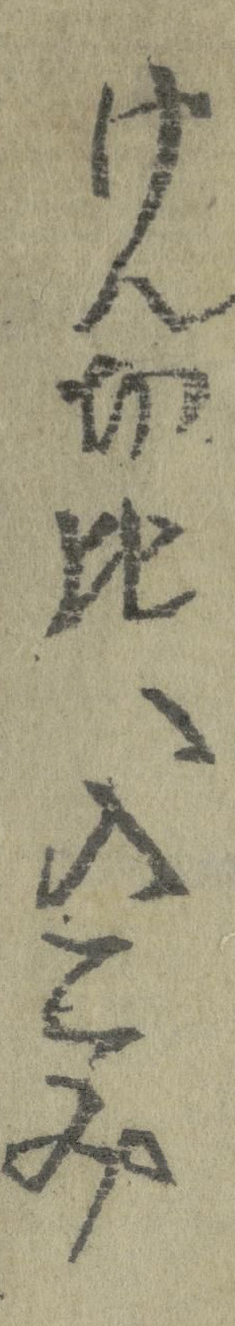けん切比へ入こみ
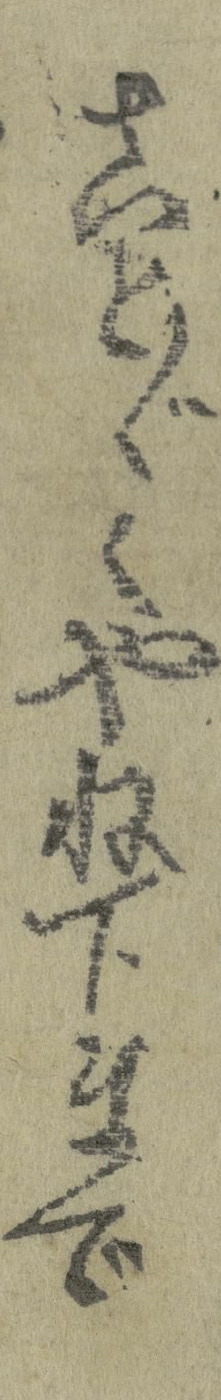こと〴〵くやね下まで
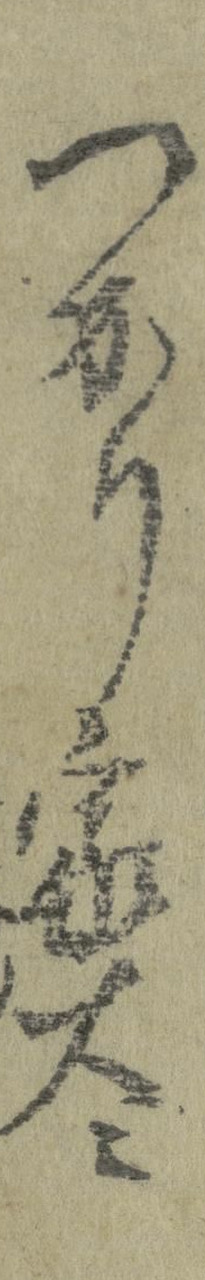つかり家大に
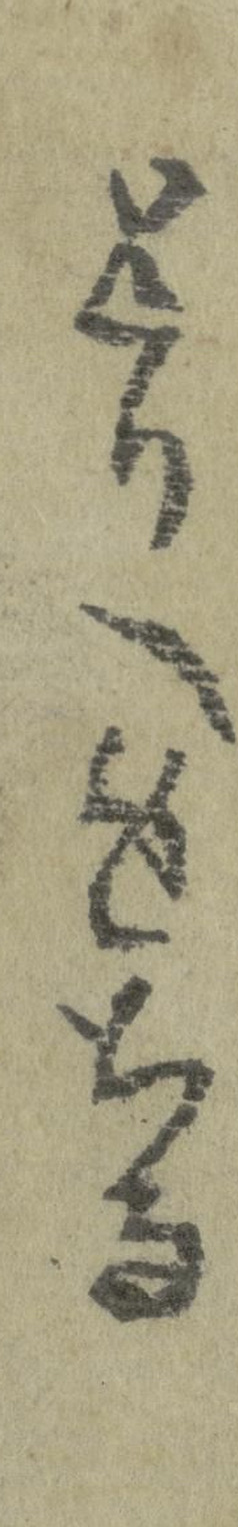とりへをちる
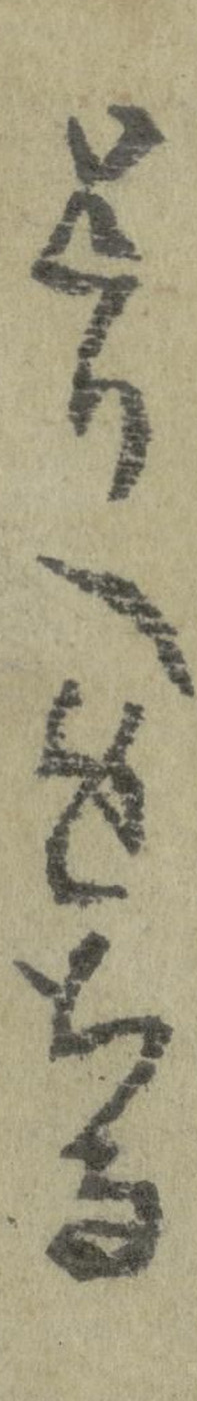とりへをちる
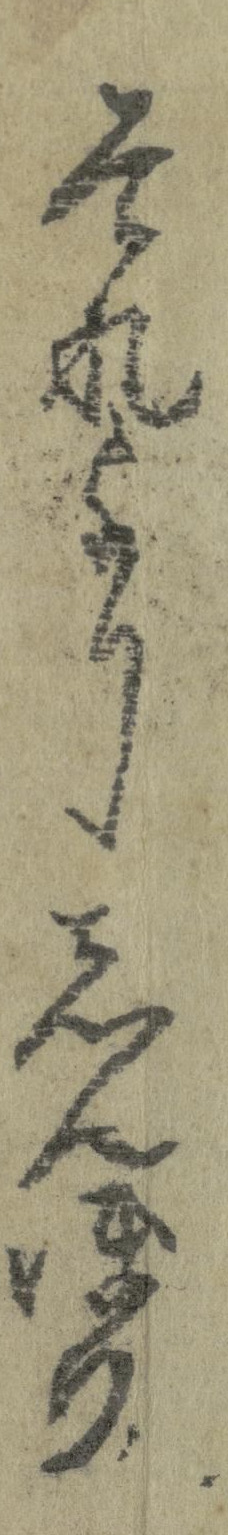それよりしんぼり
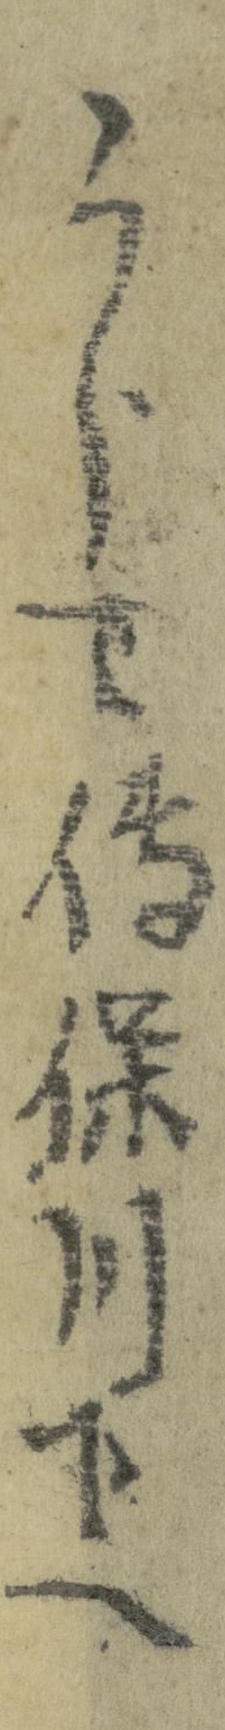こして伝保川下へ
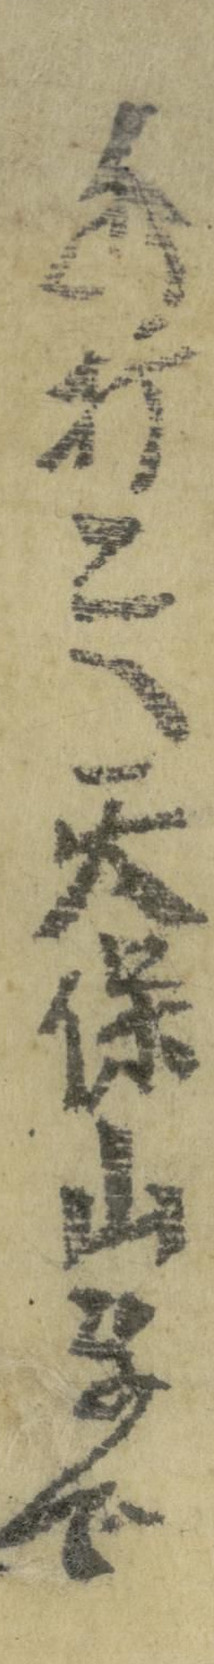水打こへ天保山まで
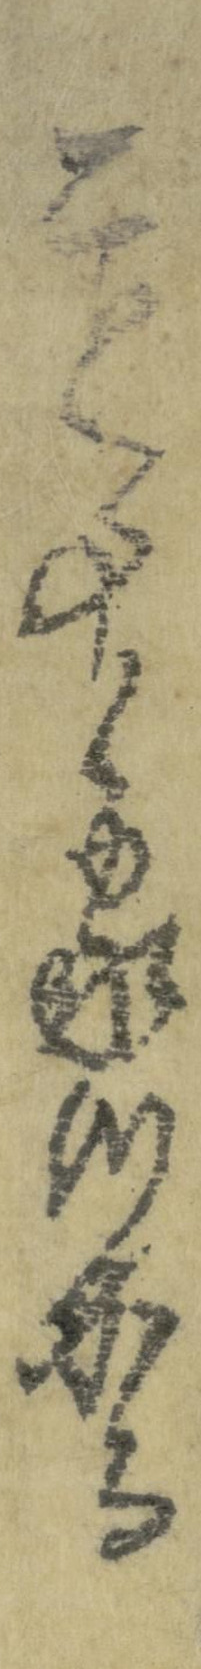こと事く家つかる
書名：慶応四辰五月　五畿内大水圖
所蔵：東京大学地震研究所図書室 Earthquake Research Institute Library, The University of Tokyo, JAPAN
